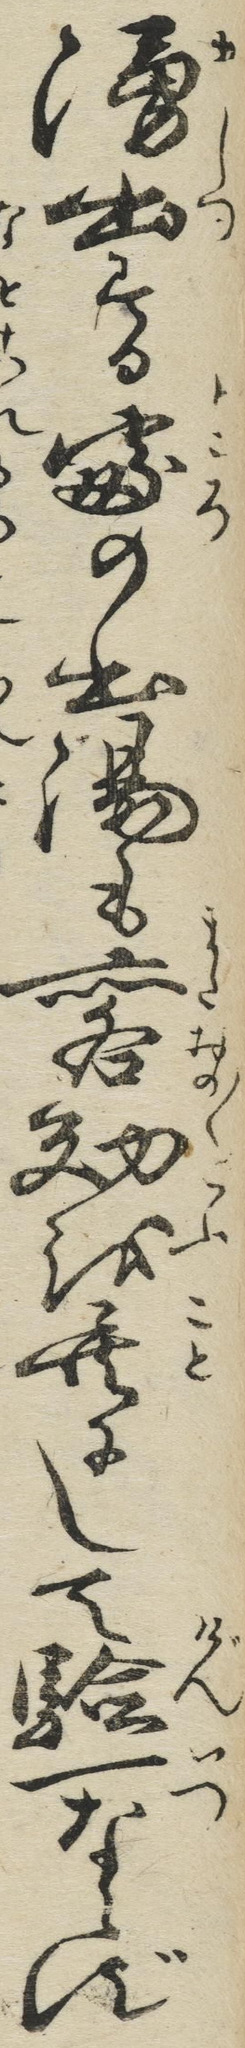湧出する處の出湯も亦各効を異にして験一ならず
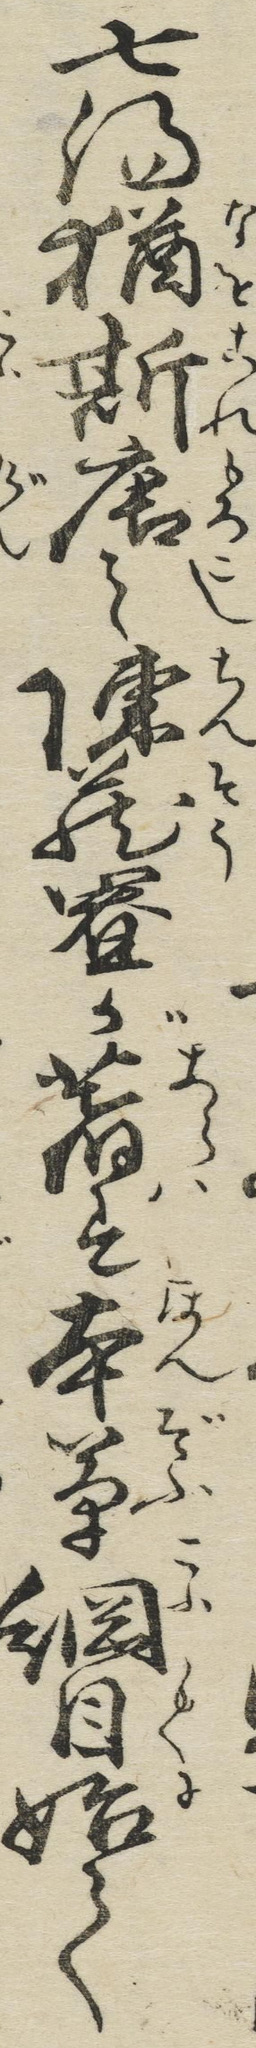七湯猶斯唐の陳蔵器が著す本草綱目始て
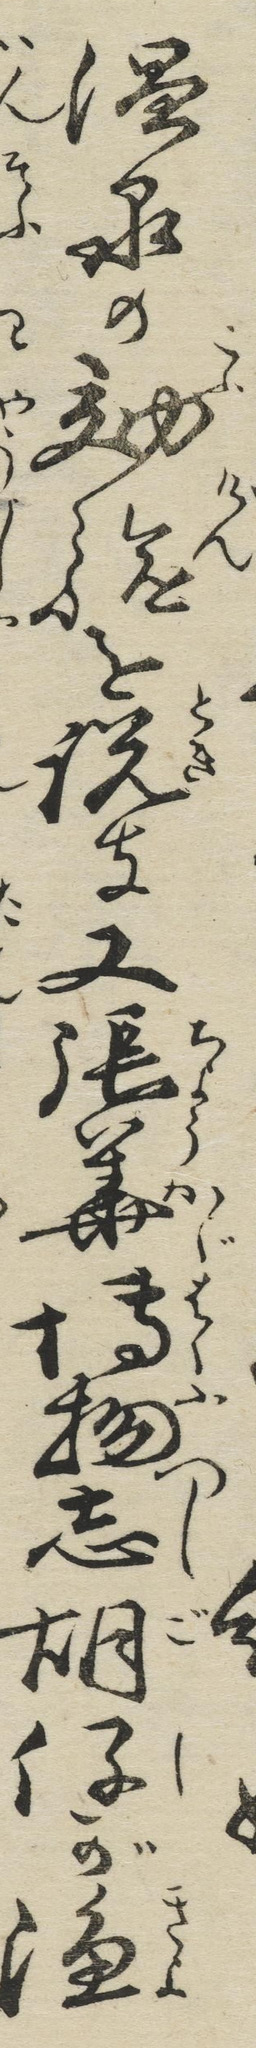温泉の効験を説き又張華博物誌胡仔が漁
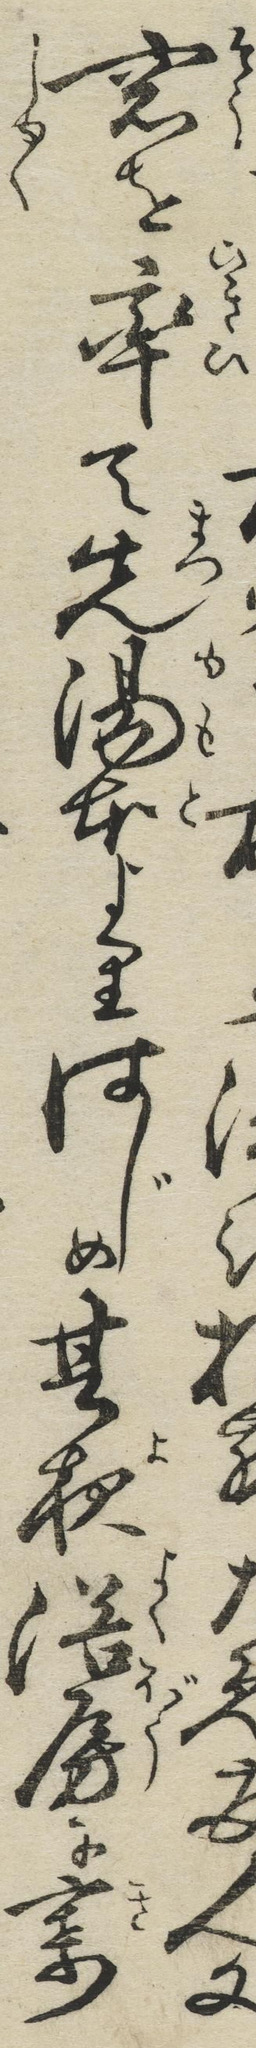窓を率て先湯本よりはじめ其夜浴房に寄

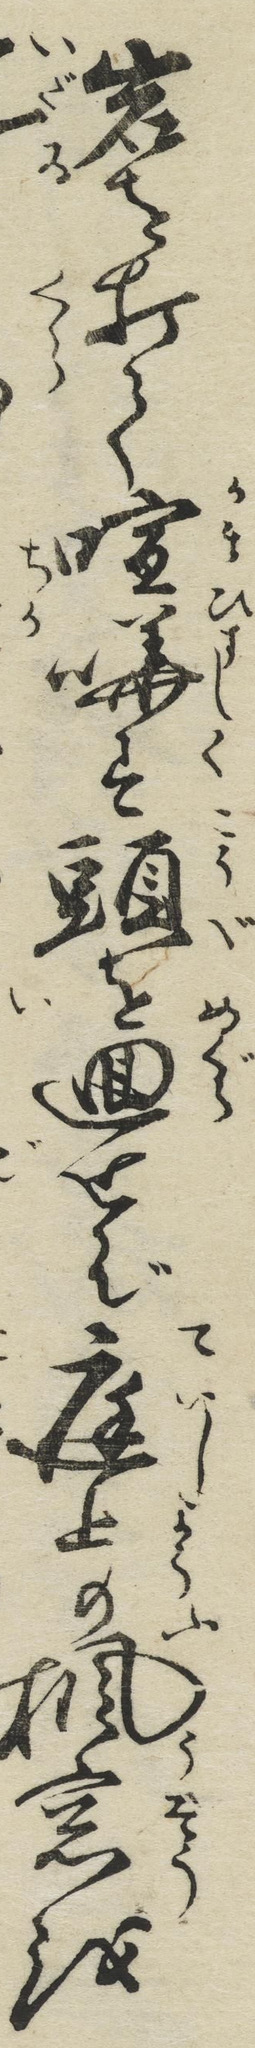岩を打て喧嘩す頭を廻せば庭上の楓窓を
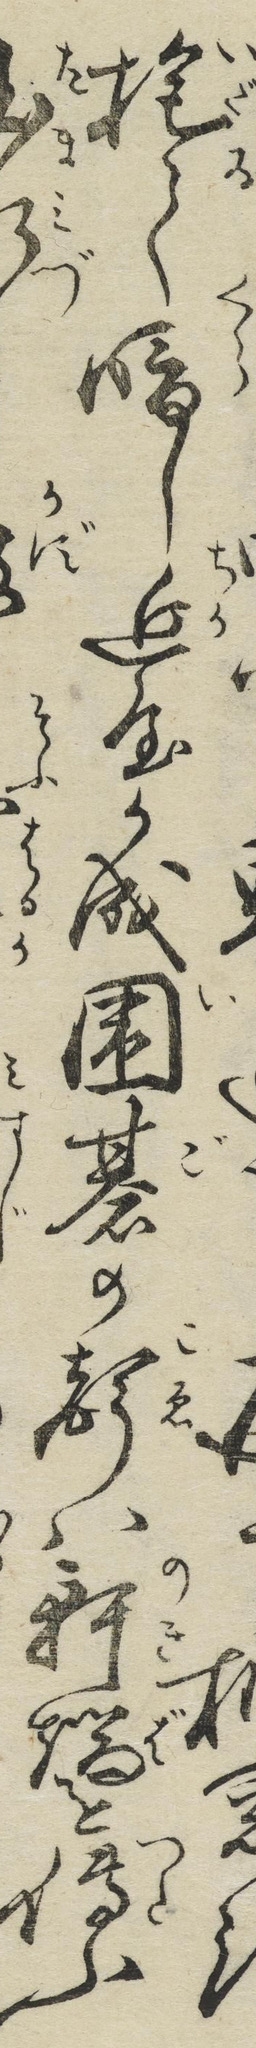抱て暗し近至か成圍碁の聲は軒端を傳ふ
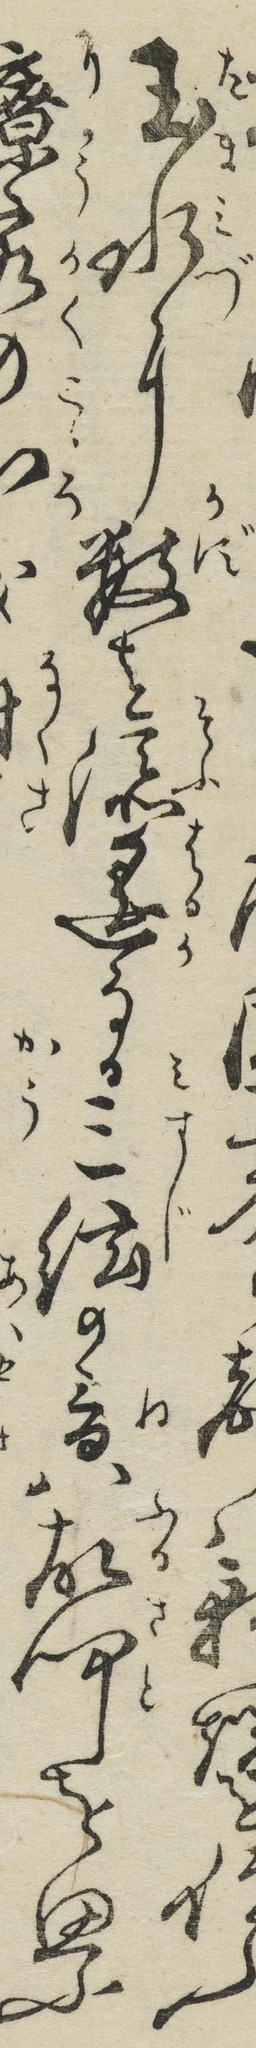玉水に数を添遙なる三絃の音は故郷を思ふ
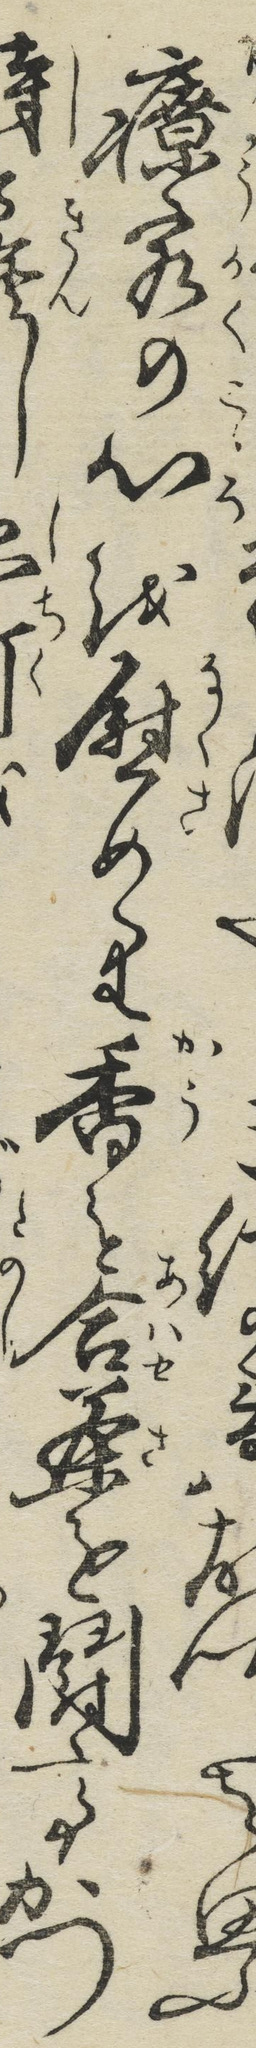療客の心を慰めるは香を合茶を闘てかつ
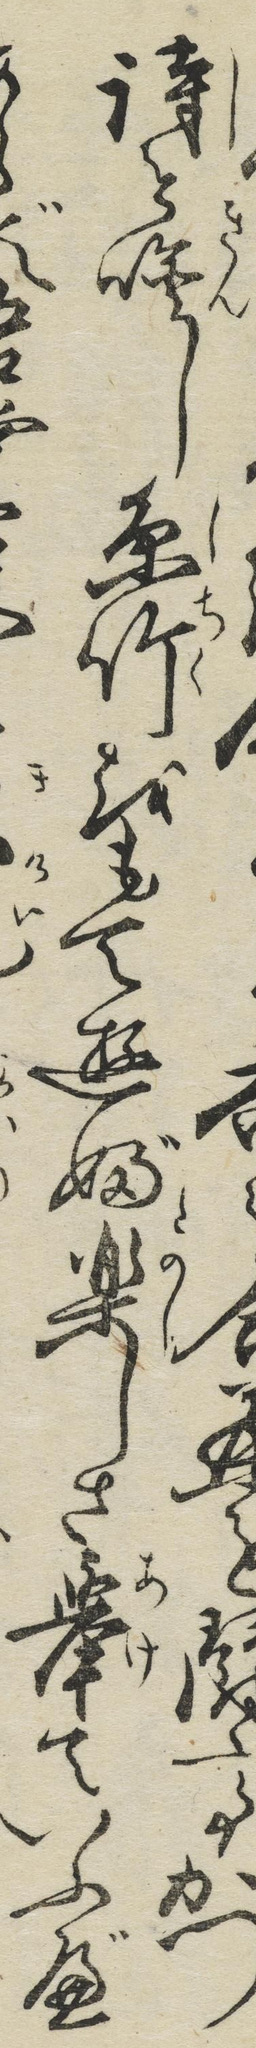詩を唫し糸竹をもて遊ぶ楽しさ舉ていふべ
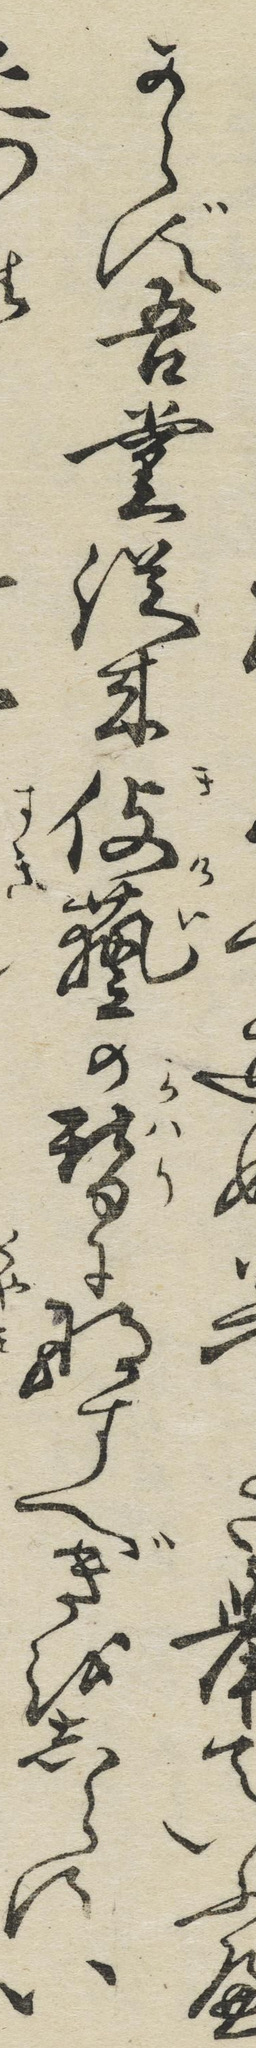からず吾黨従来伎藝の替になすべきをしらすい
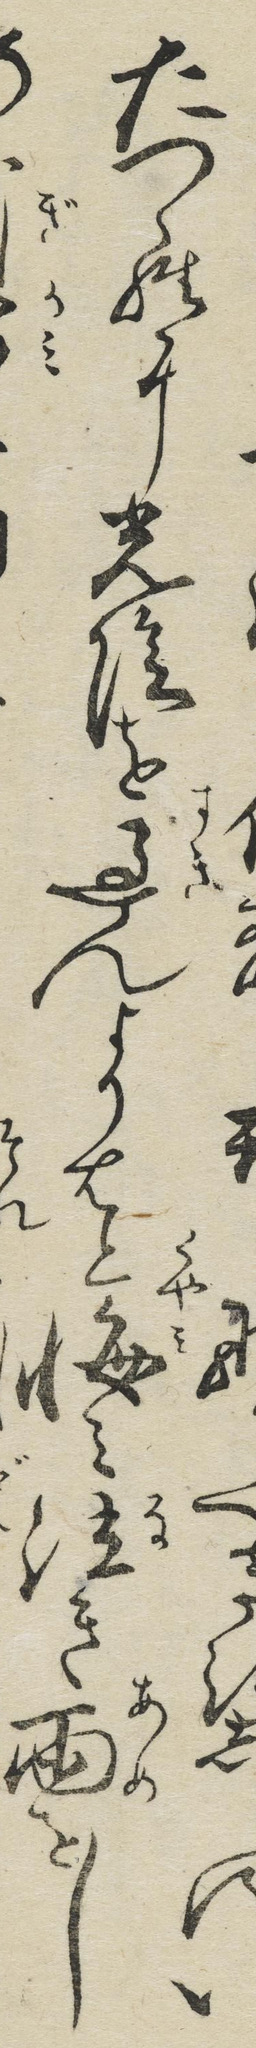たつらに光陰を過んよりはと悔み泣き雨をし
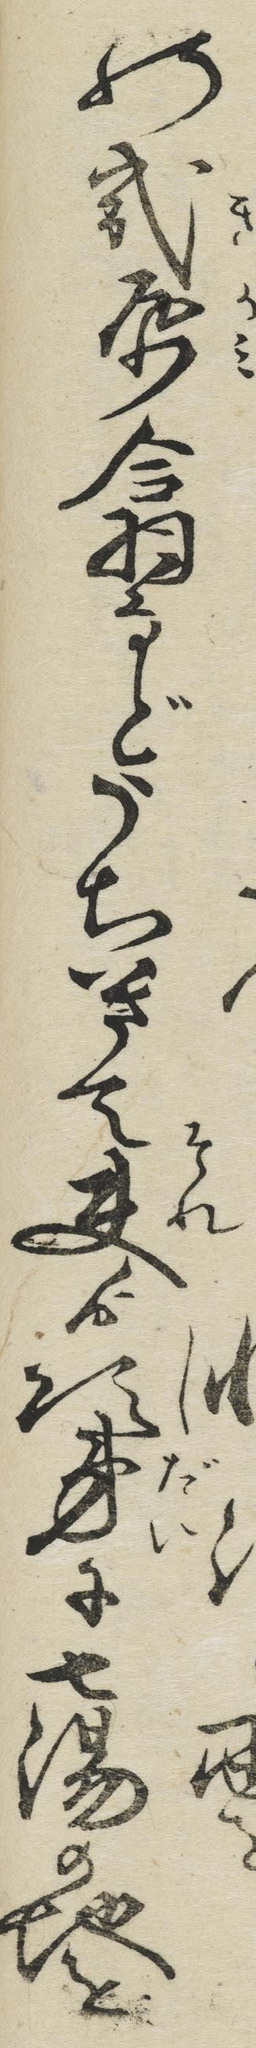の幾紙合羽などうちきて夫より次第に七湯の地を
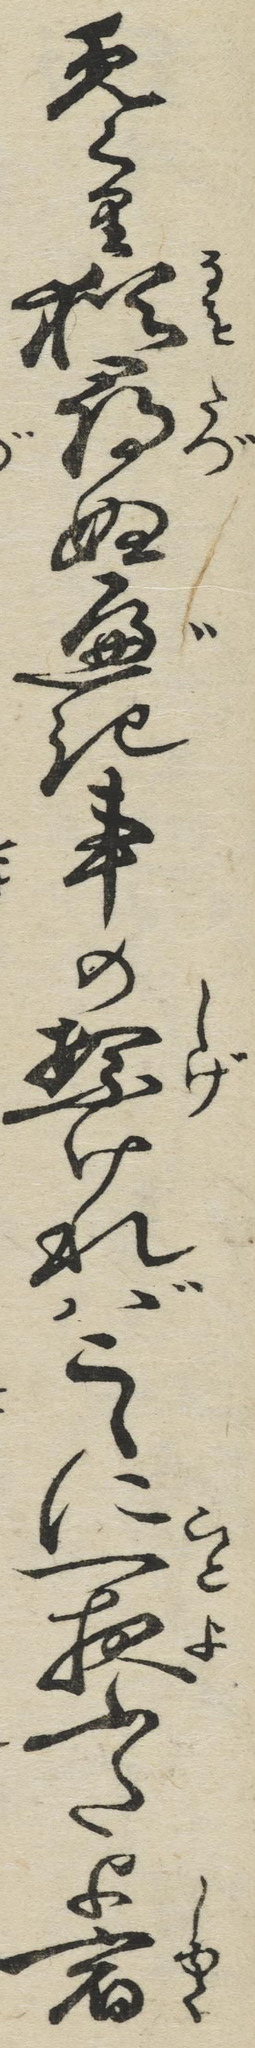めくり猶尋ぬべき事の繁ければこゝに一夜ふたよ宿
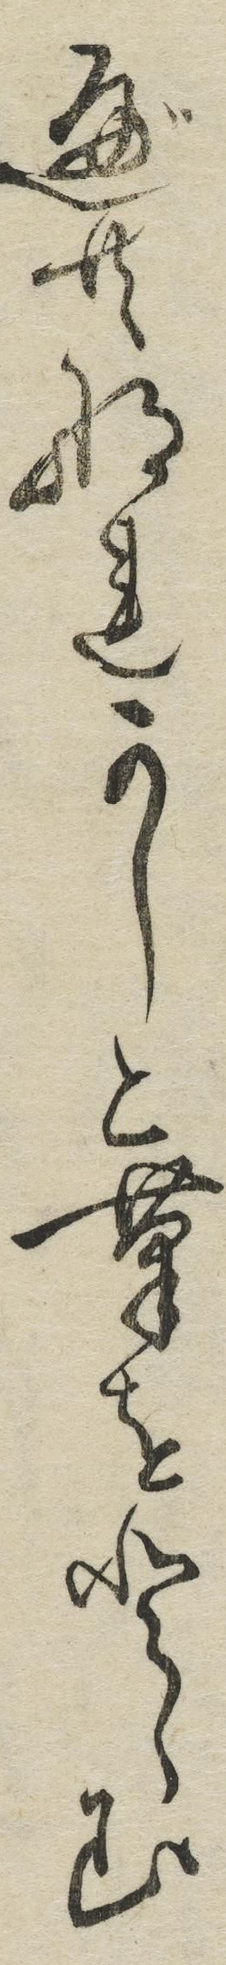べともなれかしと筆をとらむ
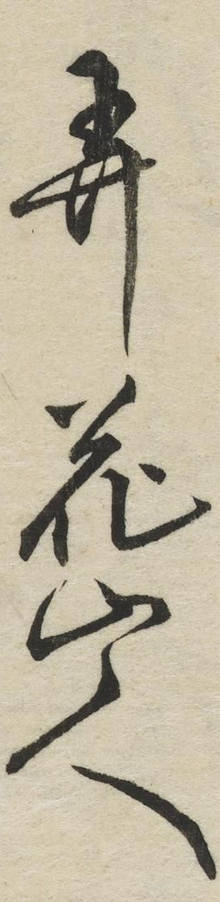弄花山人
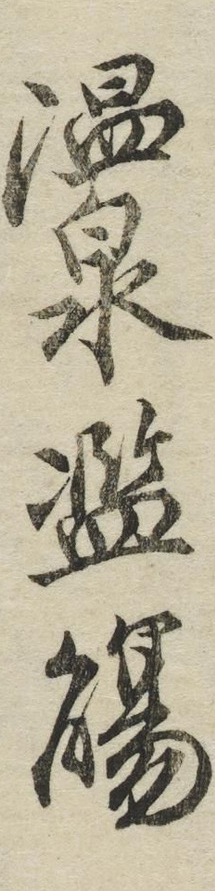温泉濫觴
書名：箱根七湯　温泉圖會　全
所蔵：東京大学地震研究所図書室 Earthquake Research Institute Library, The University of Tokyo, JAPAN
